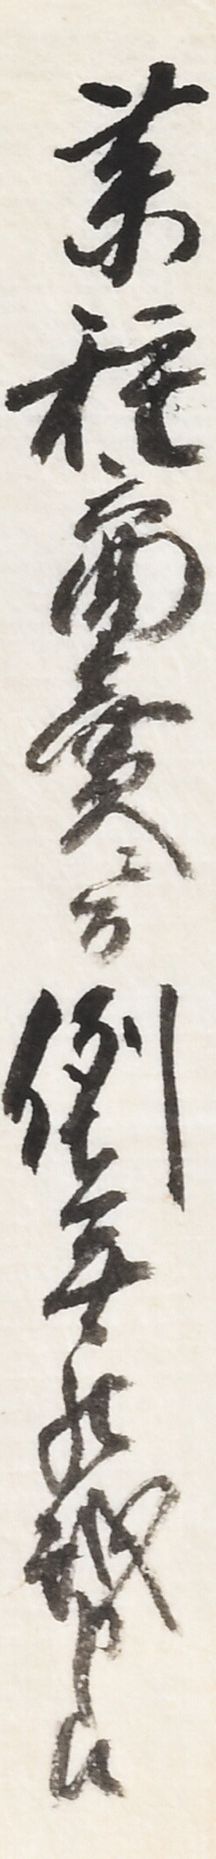薬種商売ニ而例年罷越申候
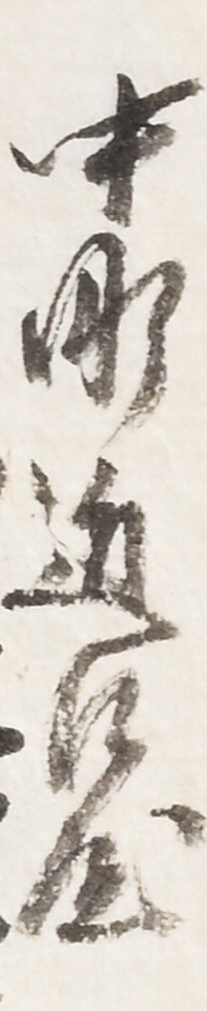中町近江屋
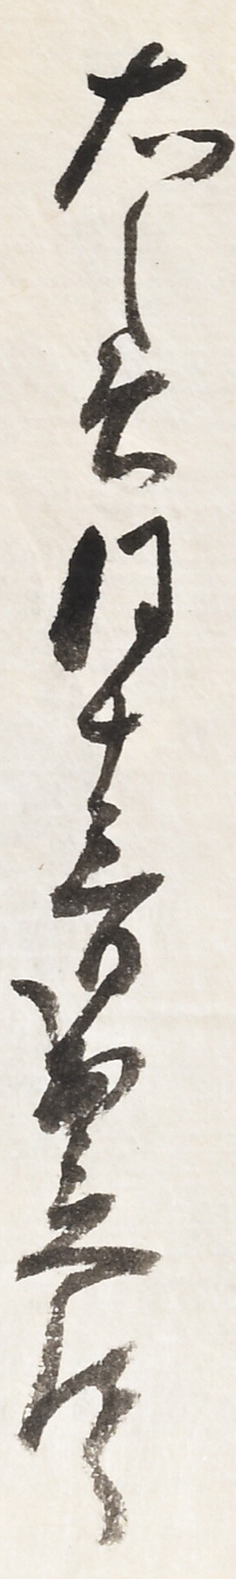右之者同十三日出立仕候
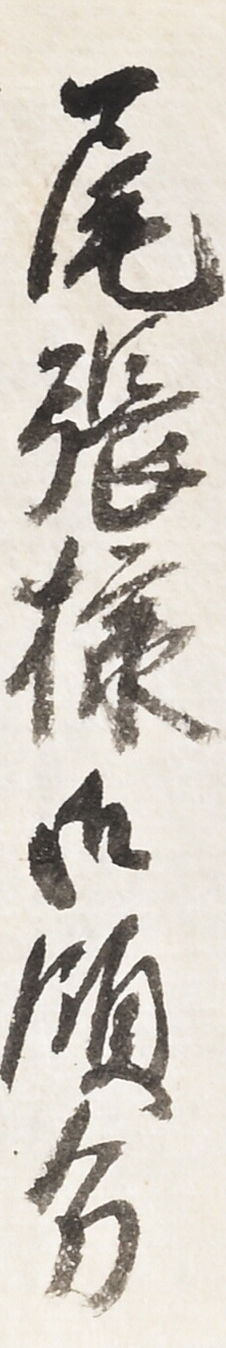尾張様御領分
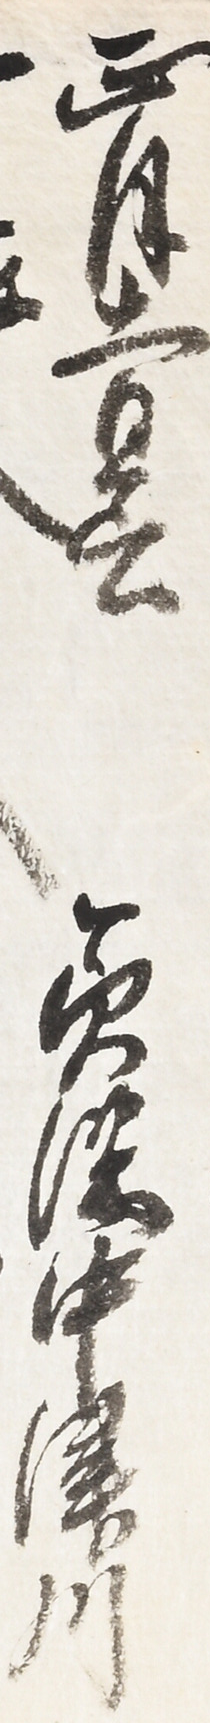正月十一日着美濃中津川
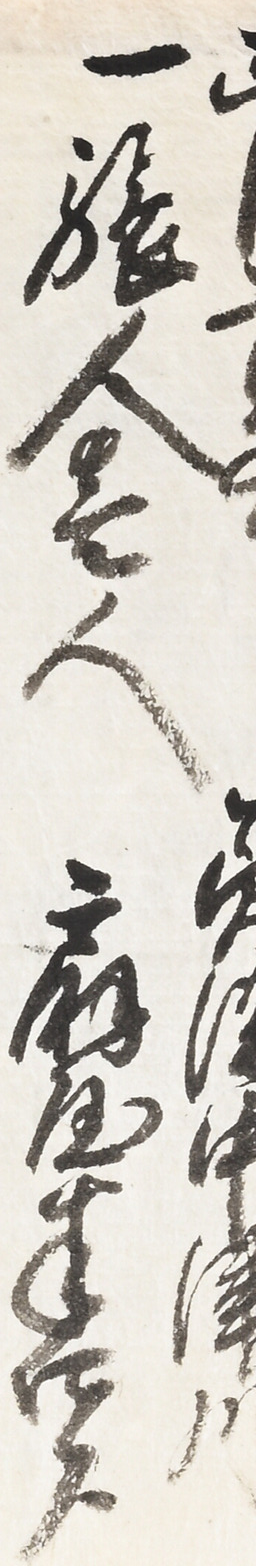一旅人壱人扇屋半四郎
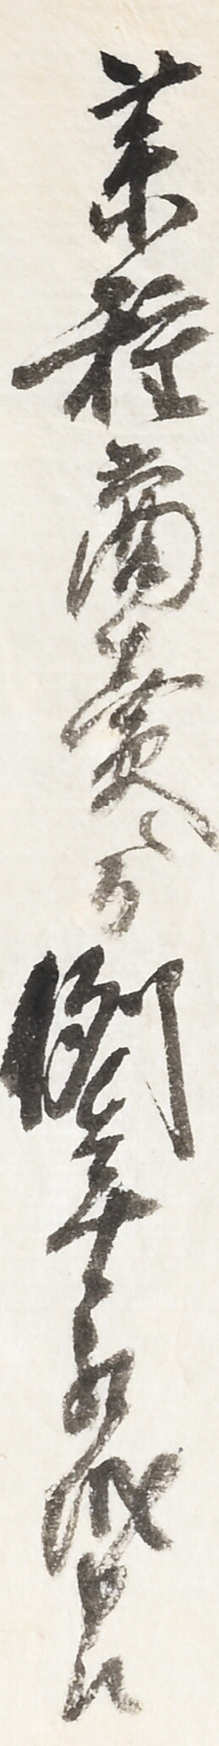薬種商売ニ而例年罷越申候
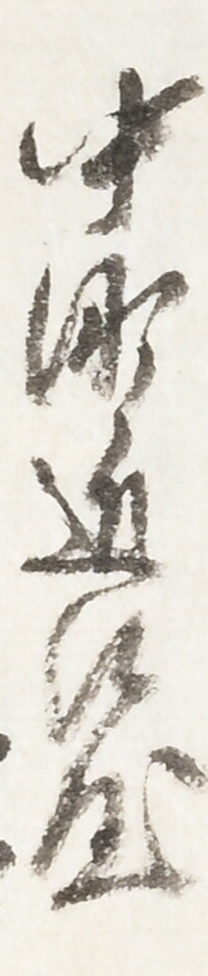中町近江屋
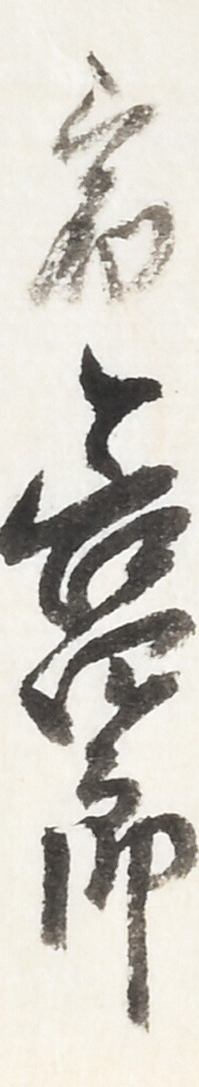宿善四郎
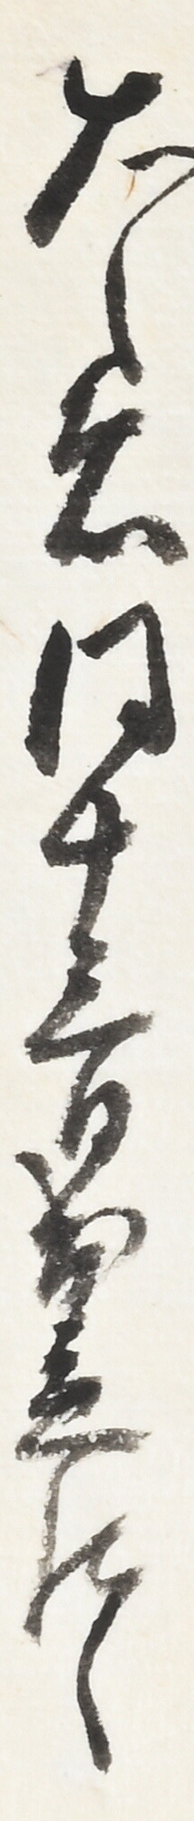右之者同十三日出立仕候
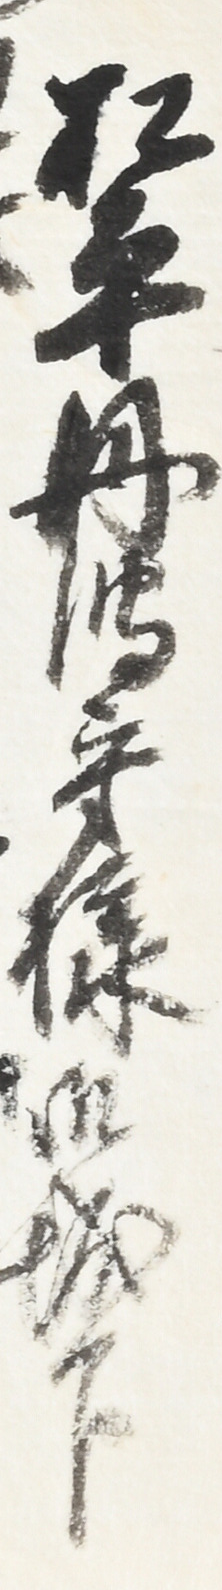松平丹波守様御城下
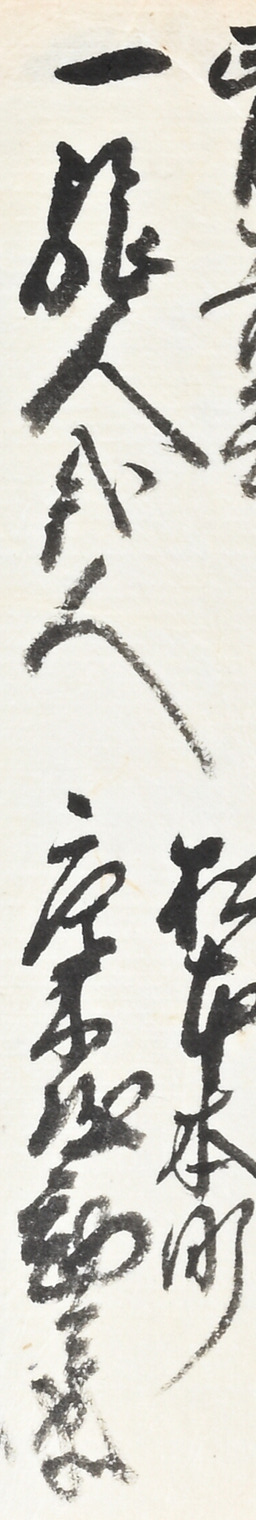一旅人弐人唐木屋勘兵衛
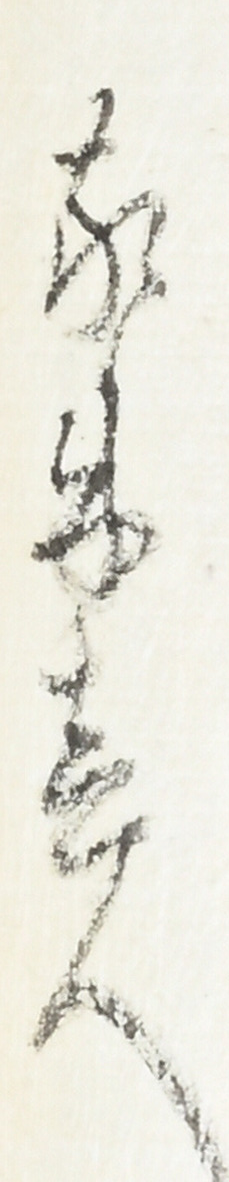家来壱人
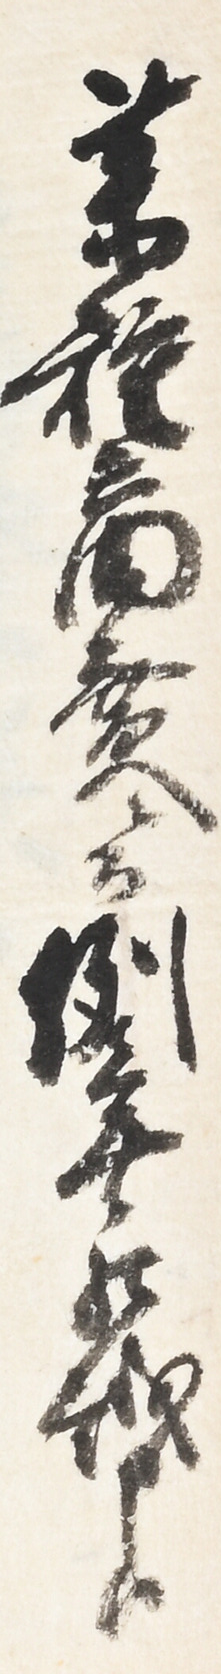薬種商売ニ而例年罷越申候
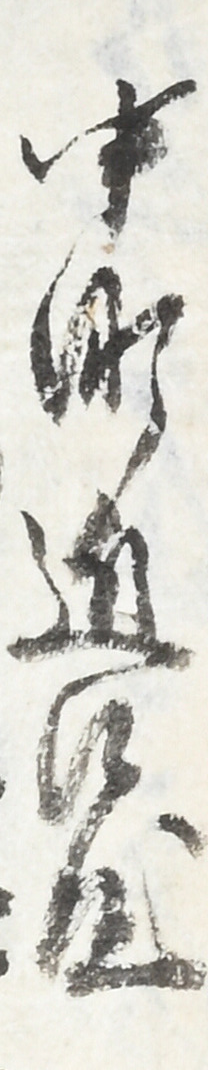中町近江屋
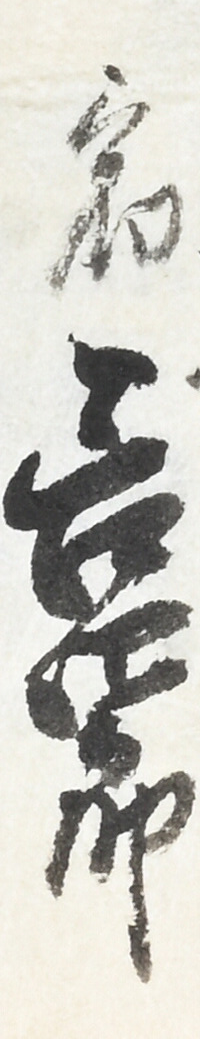宿善四郎
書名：旅人泊控帳
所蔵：伊那市立高遠町図書館・合同会社AMANE
